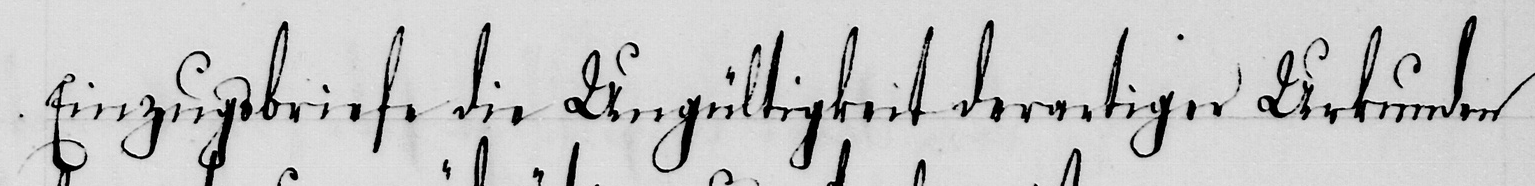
Einzugsbriefe die Ungültigkeit derartiger Urkunden
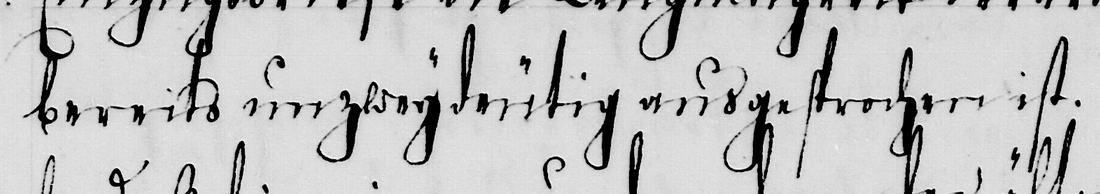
bereits unzweydeutig ausgesprochen ist.
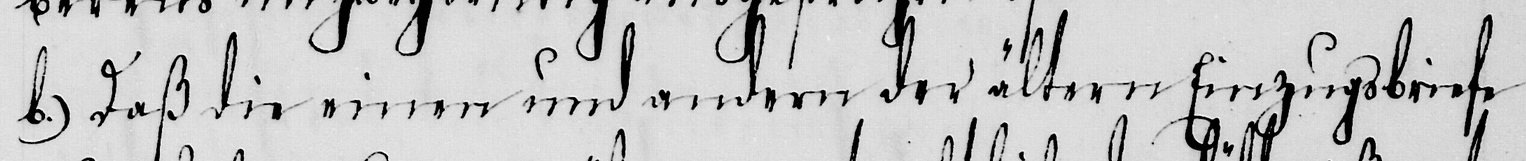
b.) Daß die einen und andern der ältern Einzugsbriefe
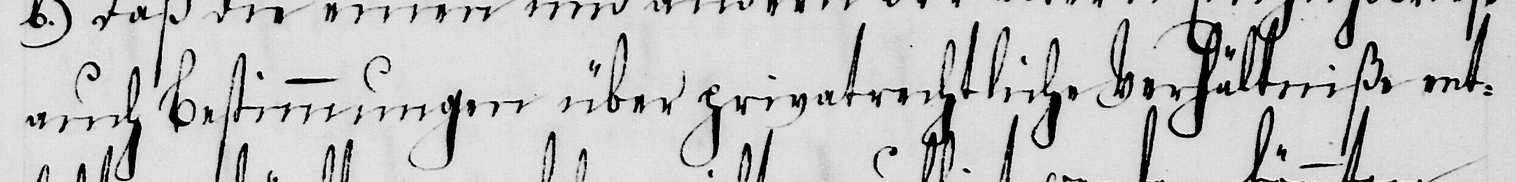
auch Bestimmungen über privatrechtliche Verhältniße ent¬
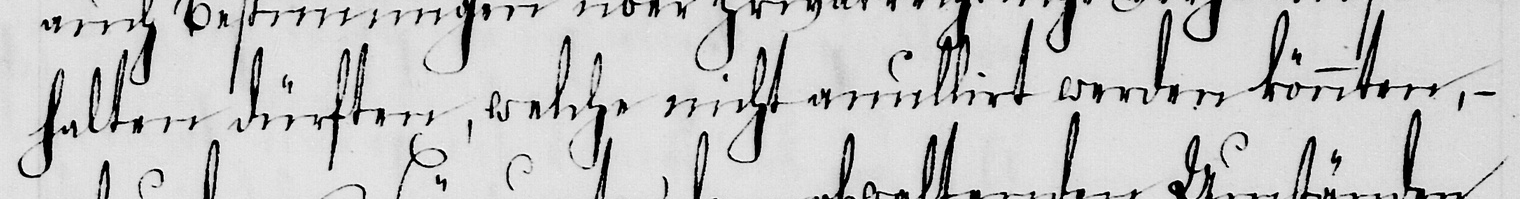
halten dürften, welche nicht annulirt werden könnten, –
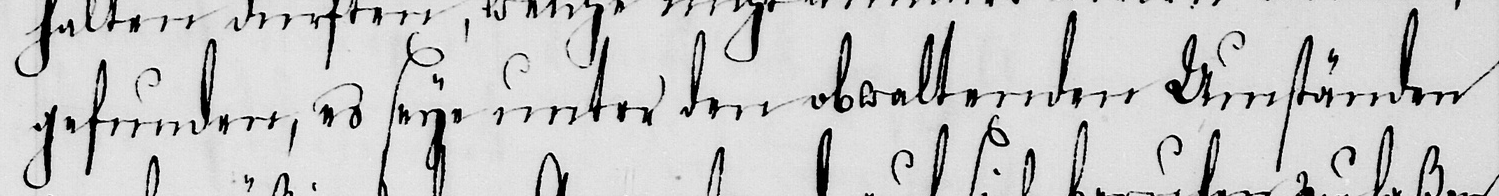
gefunden, es seye unter den obwaltenden Umständen
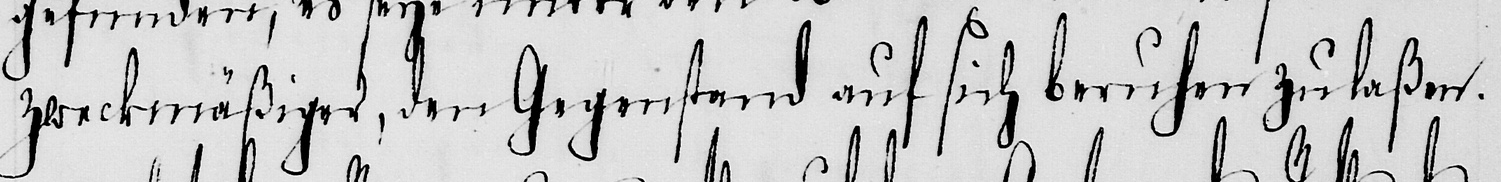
zweckmäßiger, den Gegenstand auf sich beruhen zu laßen.
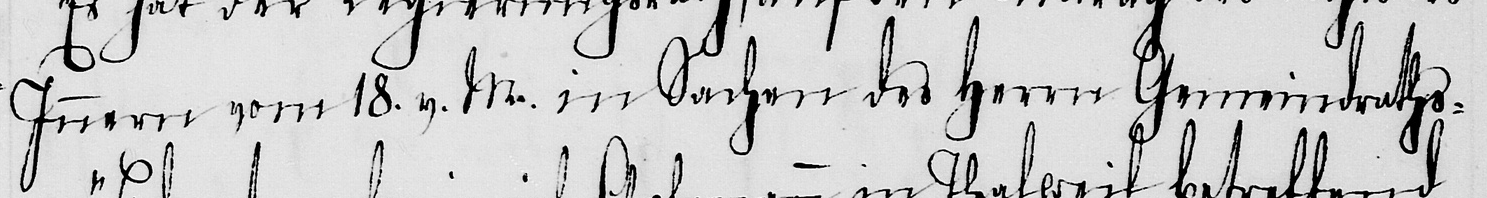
Innern vom 18. v. M. in Sachen des Herrn Gemeindraths¬
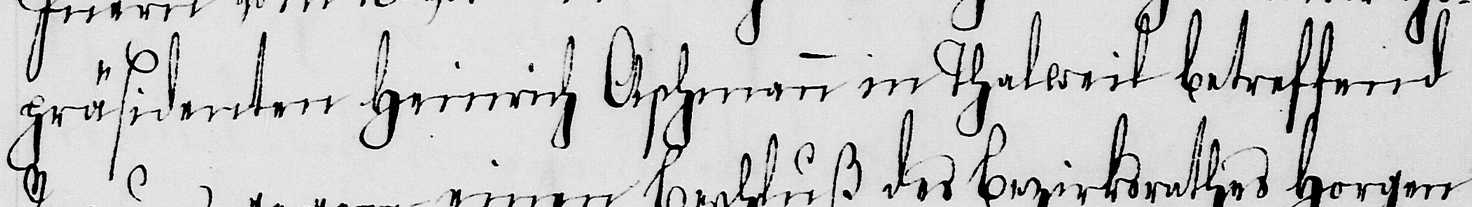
präsidenten Heinrich Aschmann in Thalweil betreffend
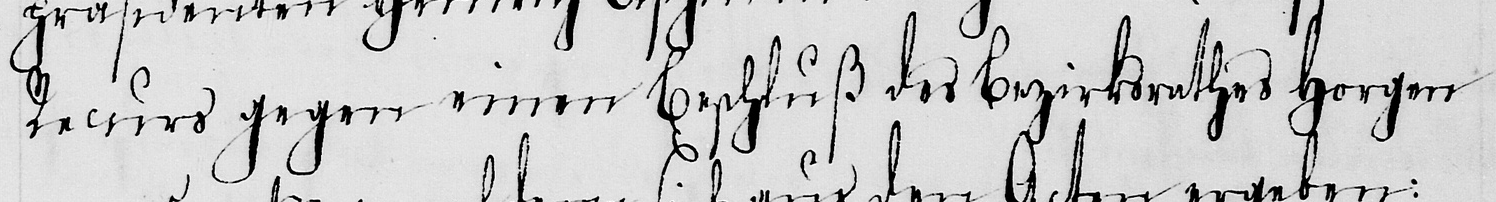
Recurs gegen einen Beschluß des Bezirksrathes Horgen
